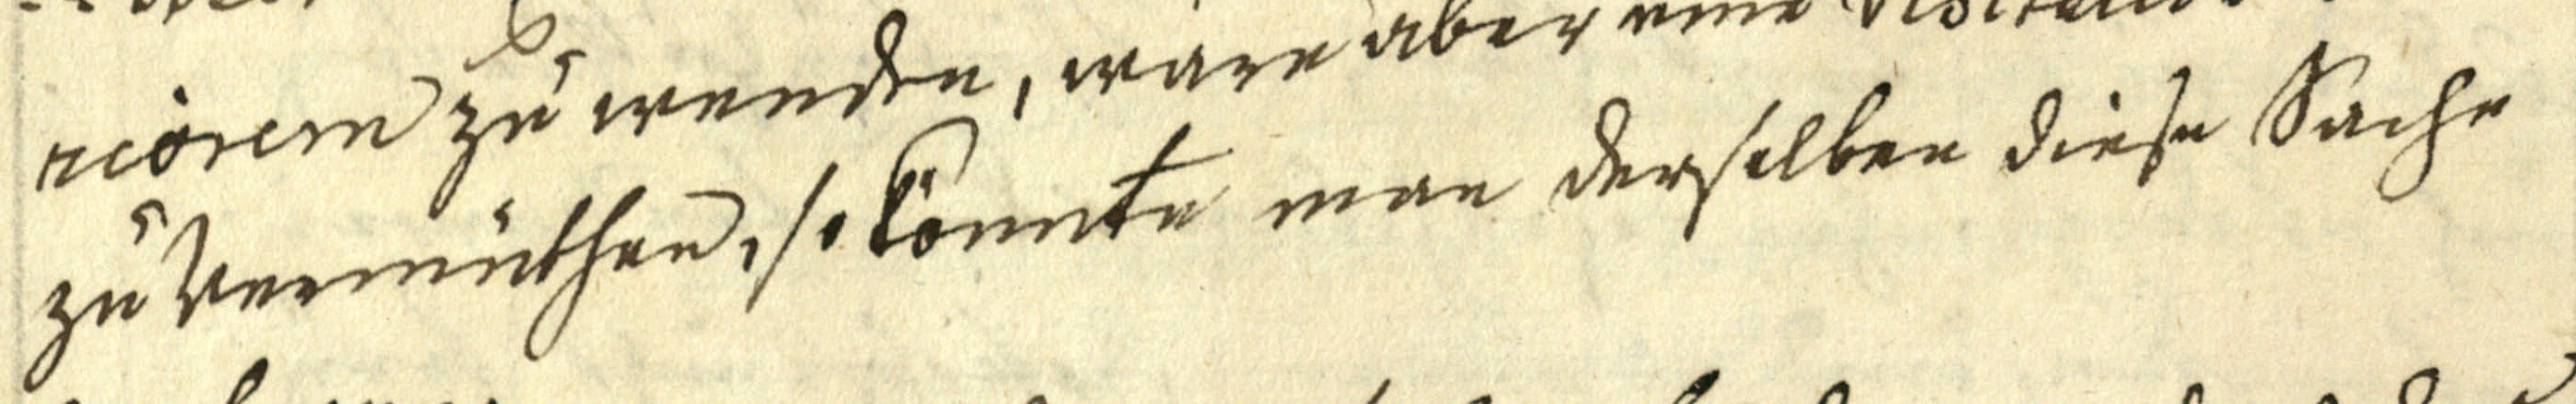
zu vermuthen, so könnte man derselben diese Sache
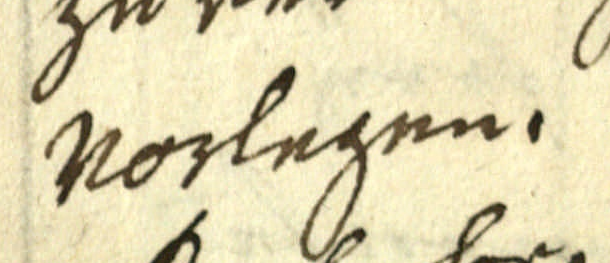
vorlegen
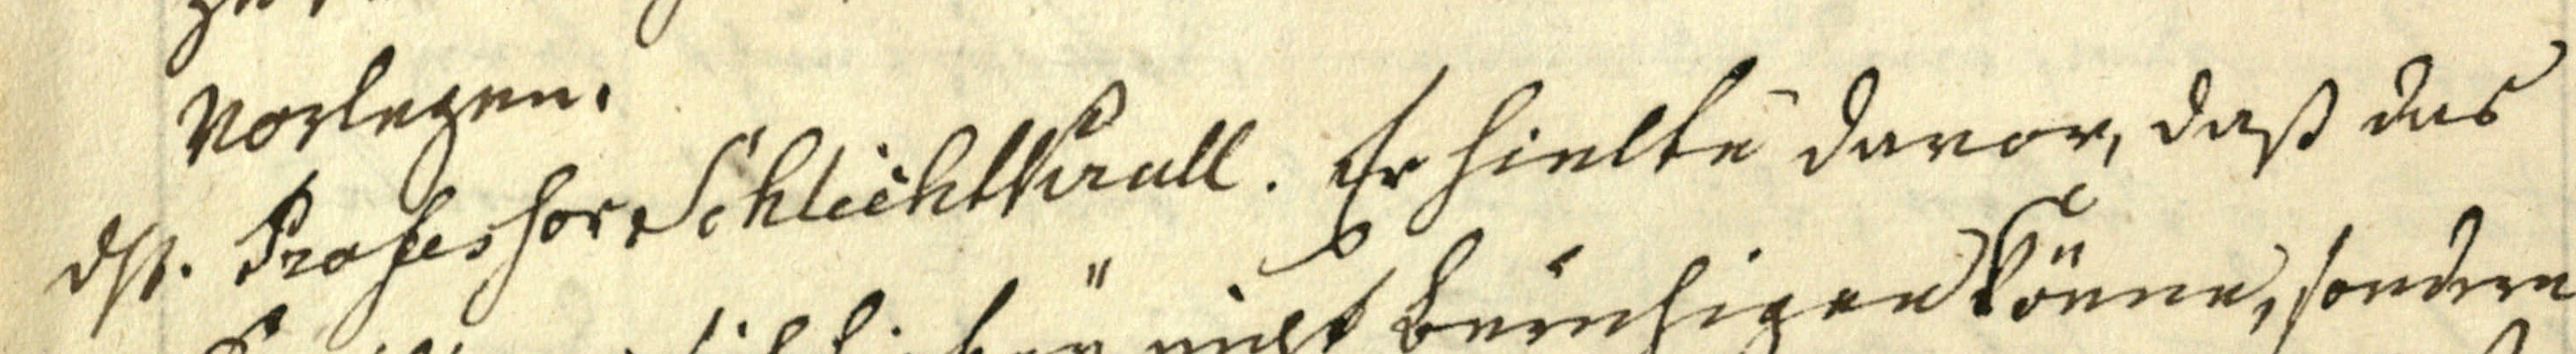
dh. Professor Schlichtkrull. Er hielte davor, daß das
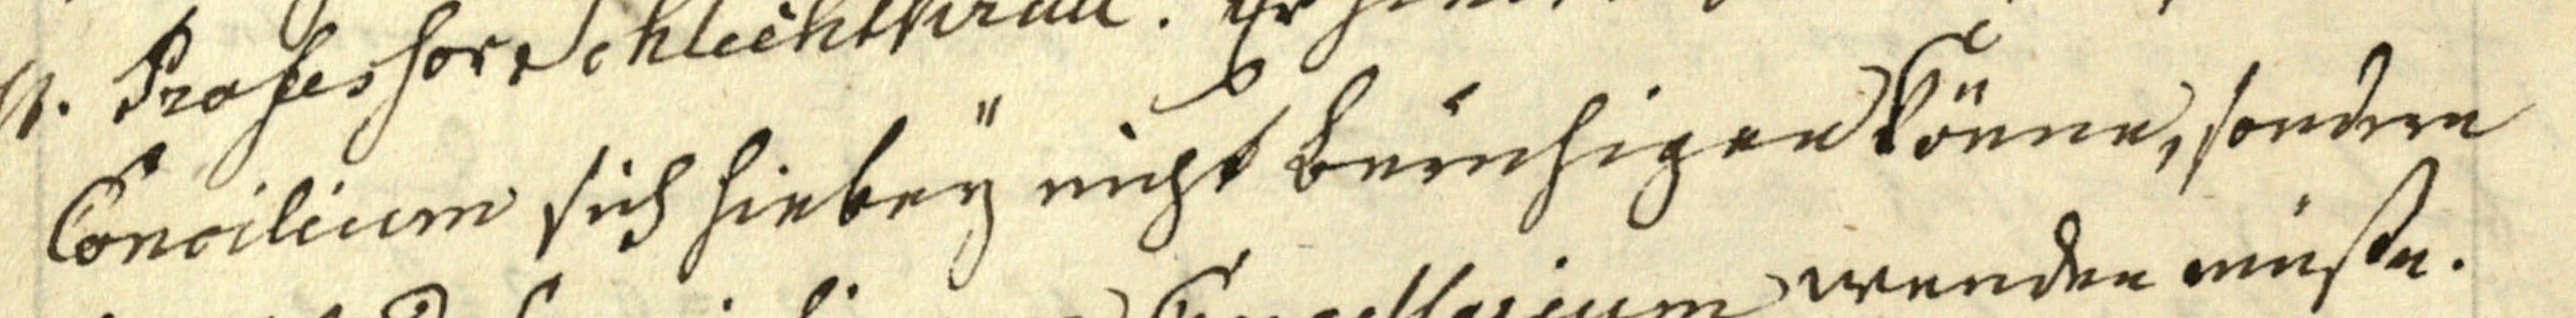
Concilium sich hiebeÿ nicht beruhigen könne, sondern
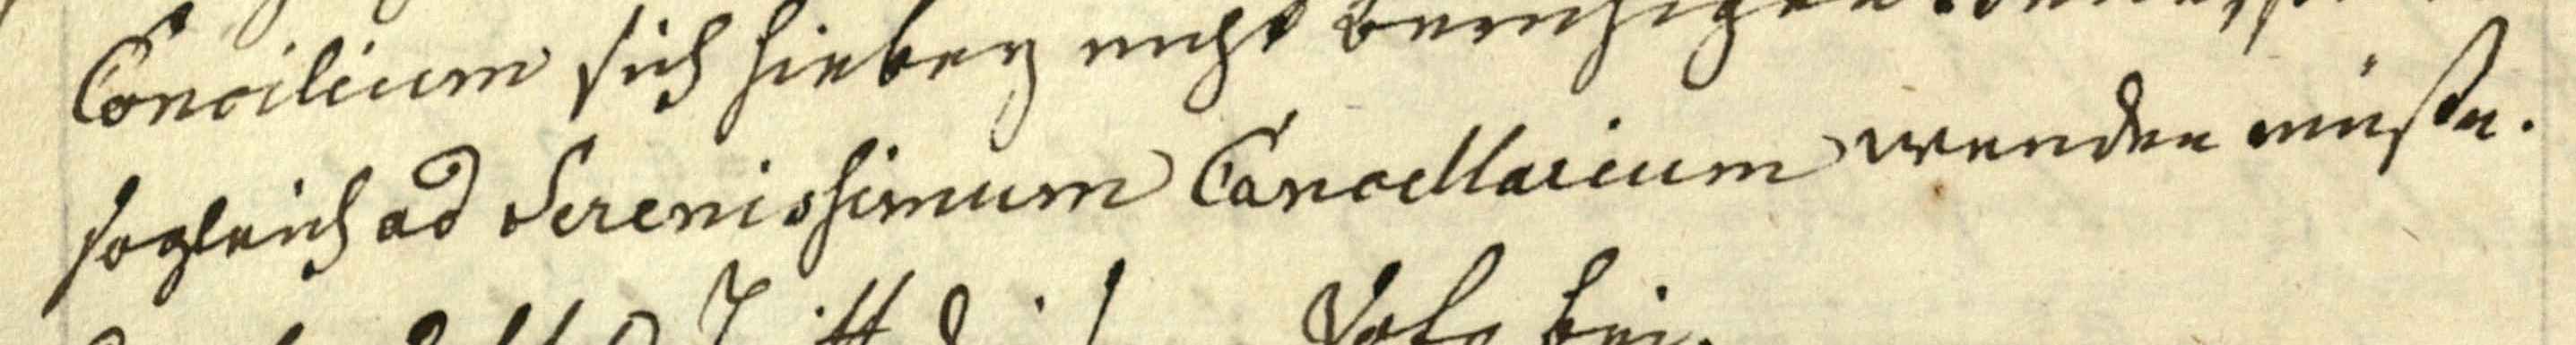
sogleich ad Serenissimum Cancellarium wenden müße.
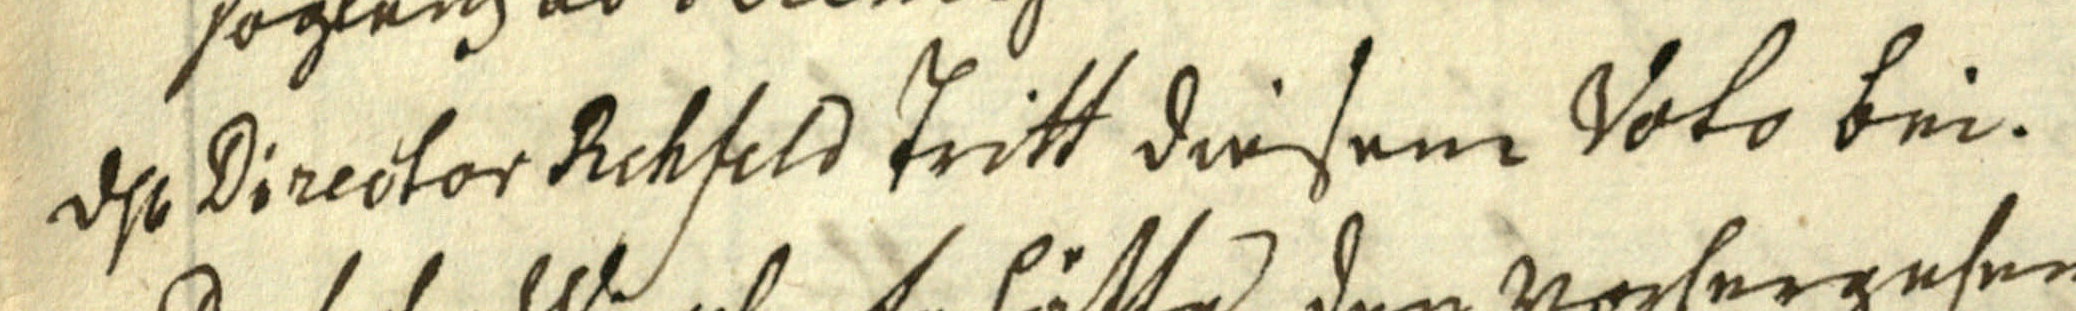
dh Director Rehfeld tritt diesem Voto bei.
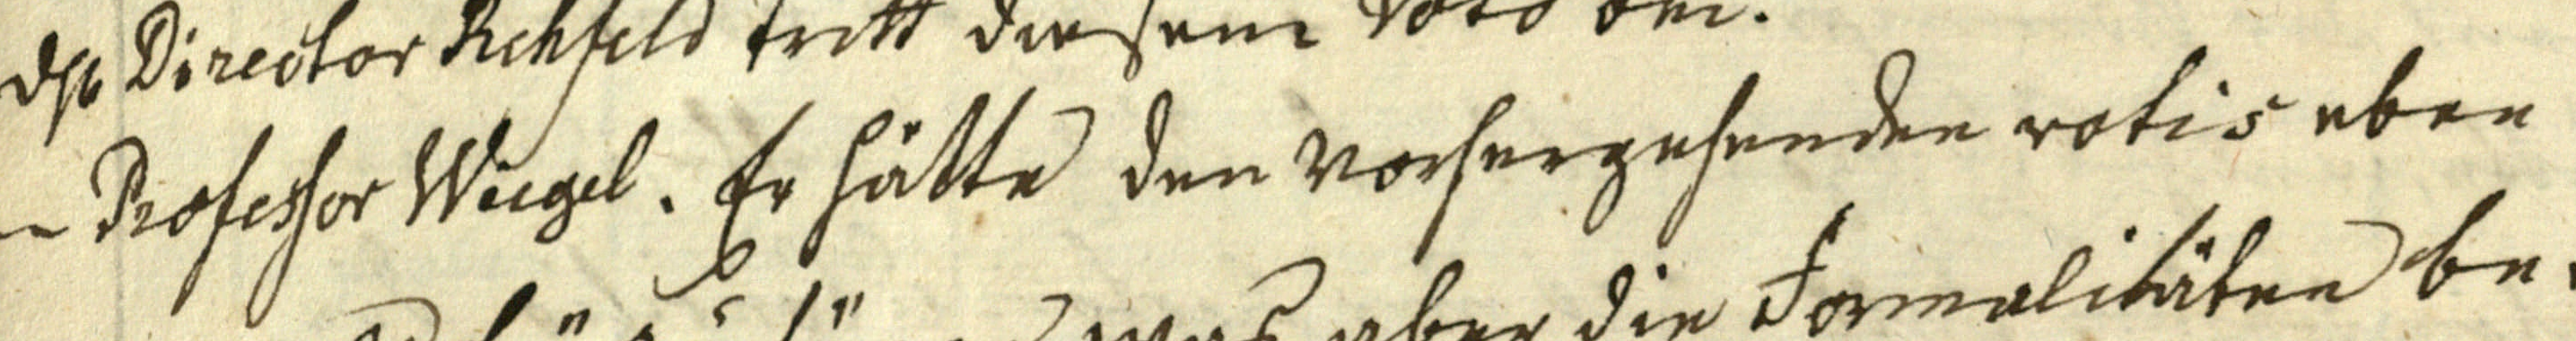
Professor Weigel. Er hätte den vorhergehenden votis eben
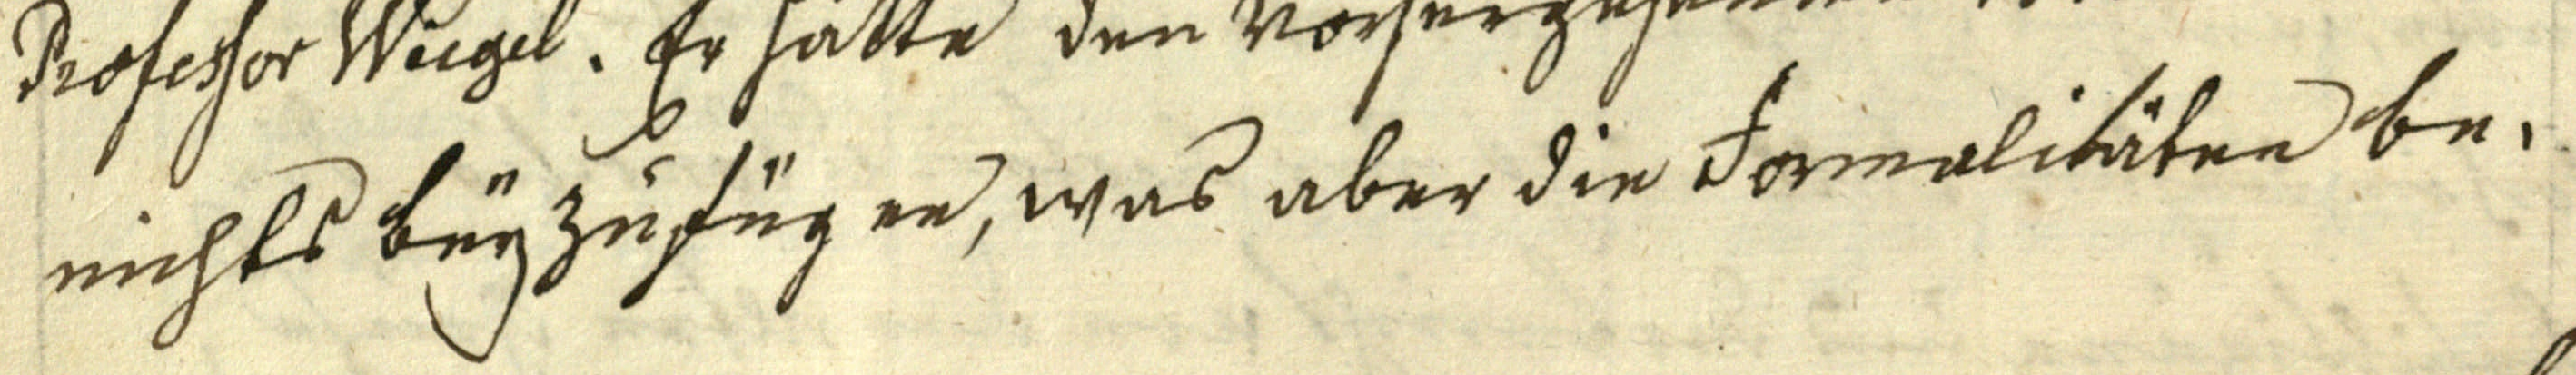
nichts beÿzufügen, was aber die Formalitäten be¬
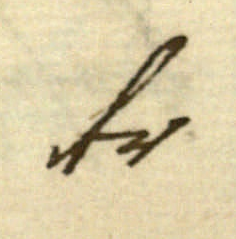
tr
